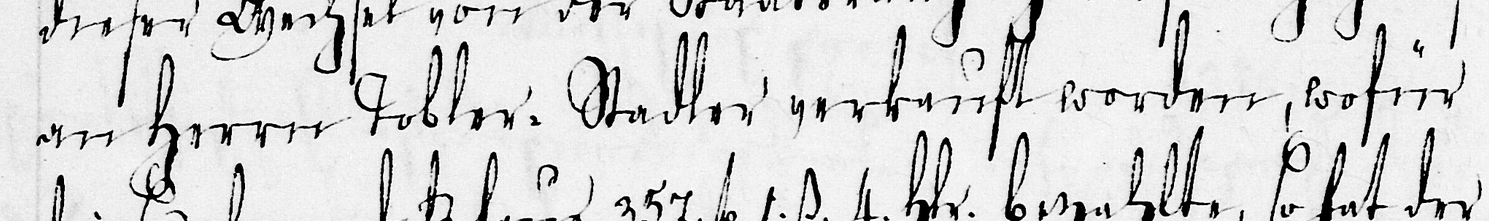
an Herrn Tobler-Stadler verkauft worden, wofür
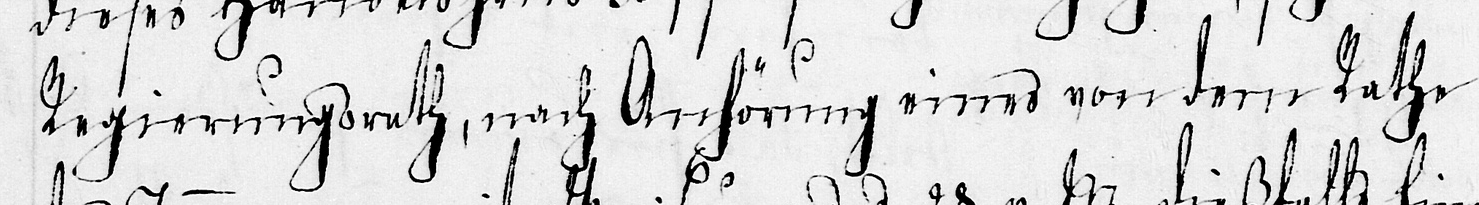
Regierungsrath, nach Anhörung eines von dem Rathe
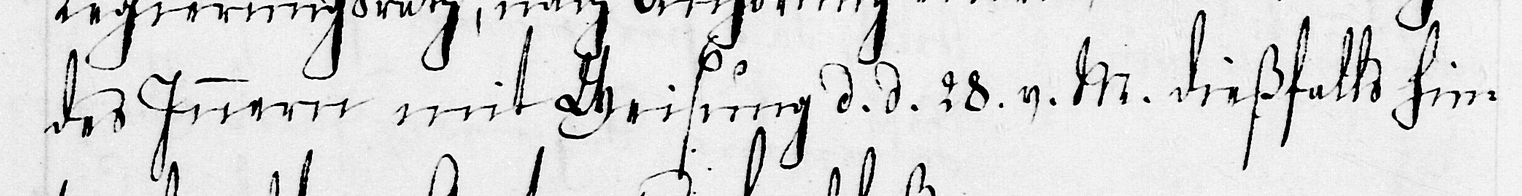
des Innern mit Weisung d. d. 28. v. M. dießfalls hin¬
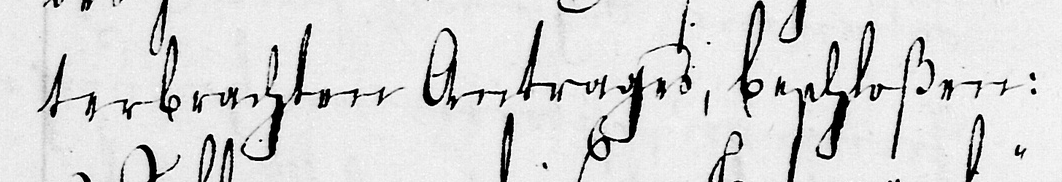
terbrachten Antrages, beschloßen:
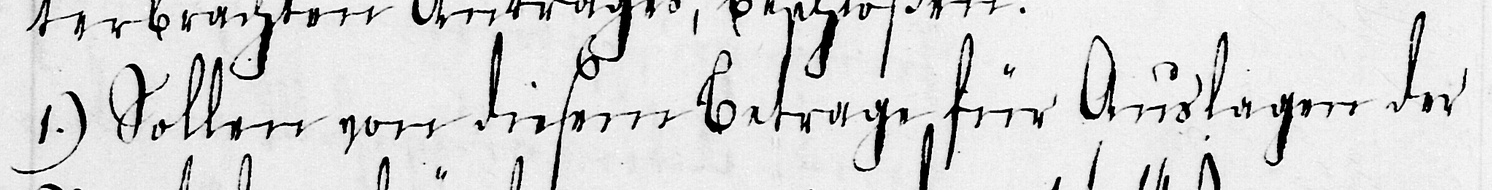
1.) Sollen von diesem Betrage für Auslagen der
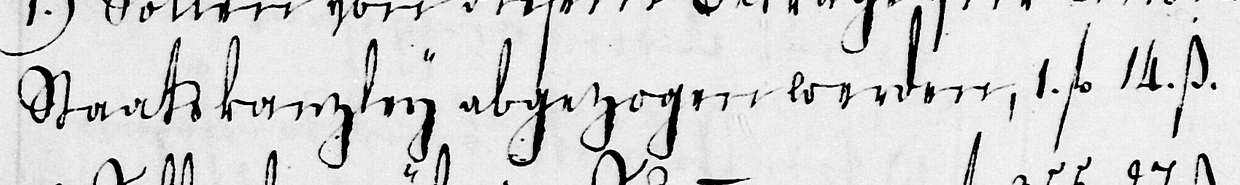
Staatskanzley abgezogen werden, 1. fl. 14. ß.
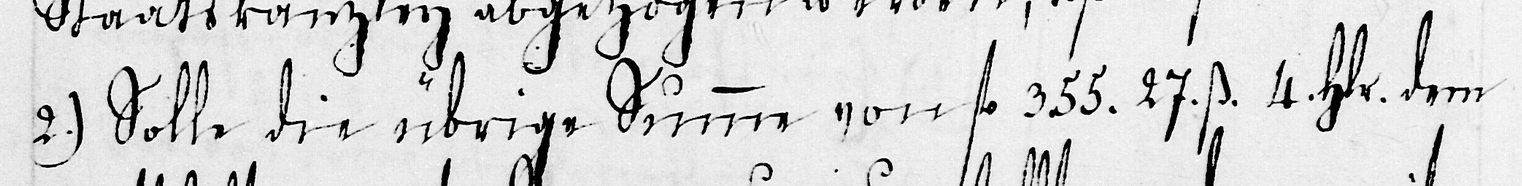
2.) Solle die übrige Summe von fl. 355. 27. ß. 4. Hlr. dem
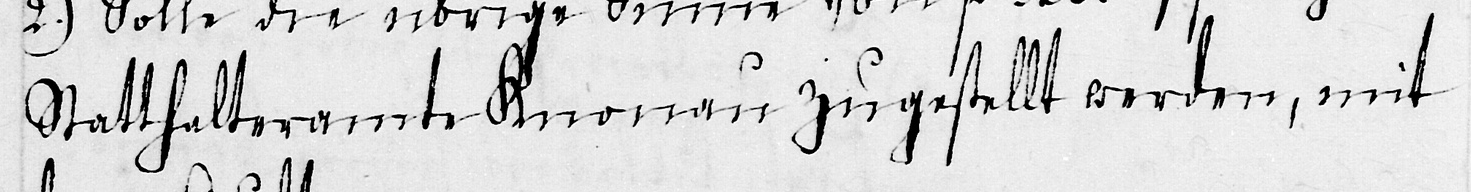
Statthalteramte Knonau zugestellt werden, mit
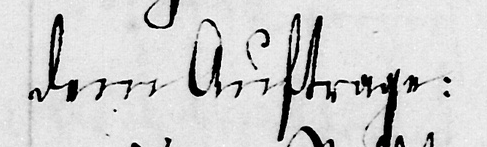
dem Auftrage:
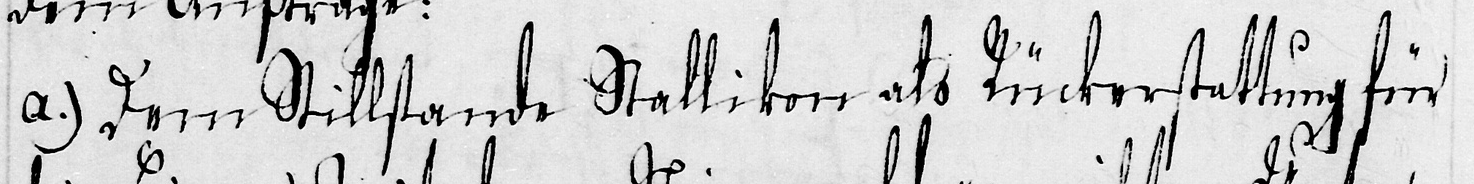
a.) Dem Stillstande Stallikon als Rückerstattung für
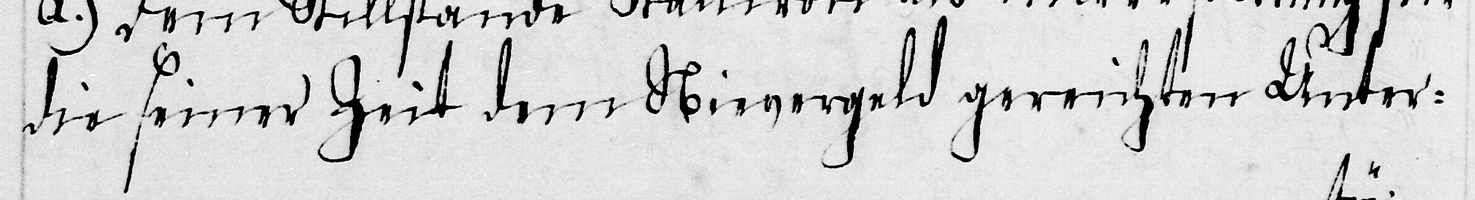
die seiner Zeit dem Nievergeld gereichten Unter-
